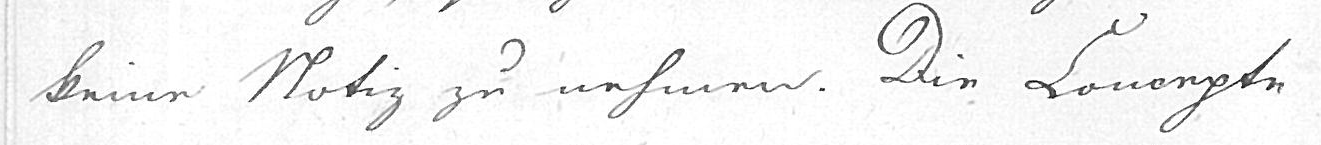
keine Notiz zu nehmen. Die Concepte
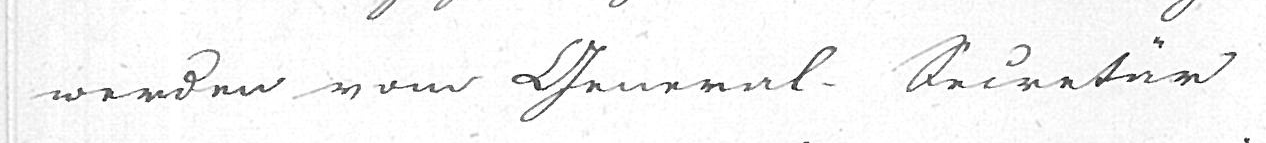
werden vom General-Secretär
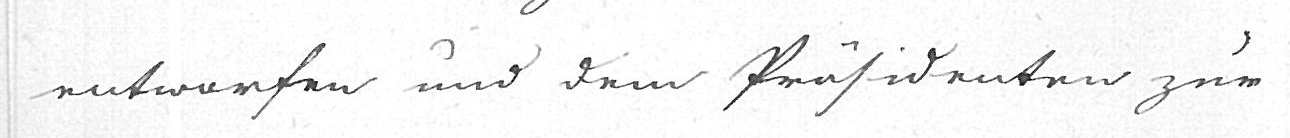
entworfen und dem Präsidenten zur
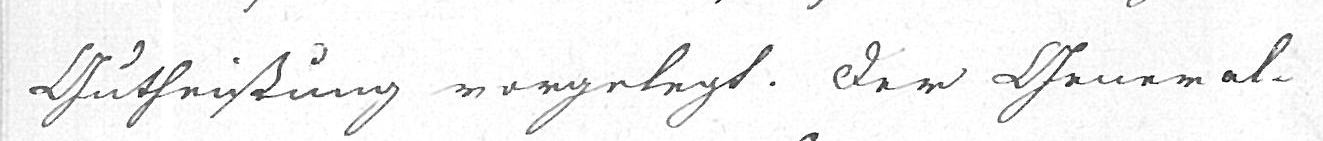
Gutheißung vorgelegt. Der General-
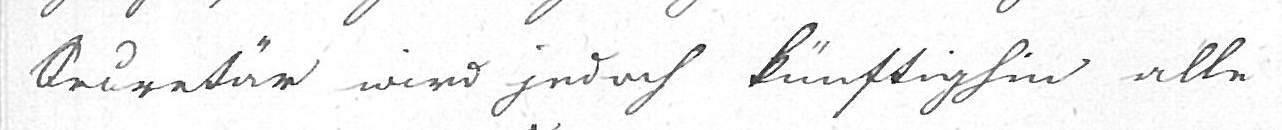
Secretär wird jedoch künftighin alle
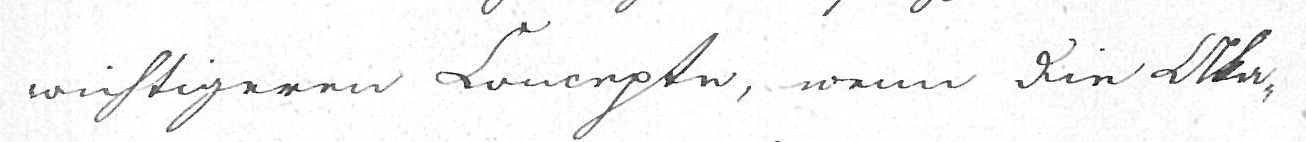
wichtigen Concepte, wenn die Aka-
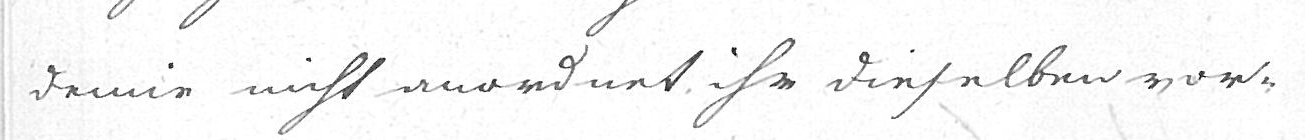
demie nicht anordnet, ihr dieselben vor-
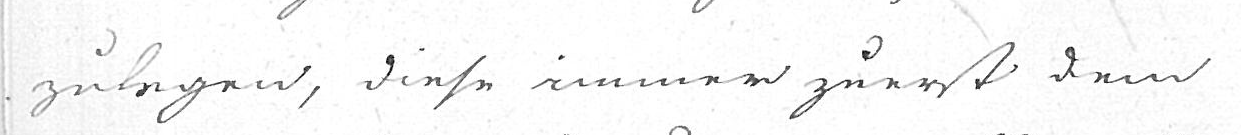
zulegen, diese immer zuerst dem
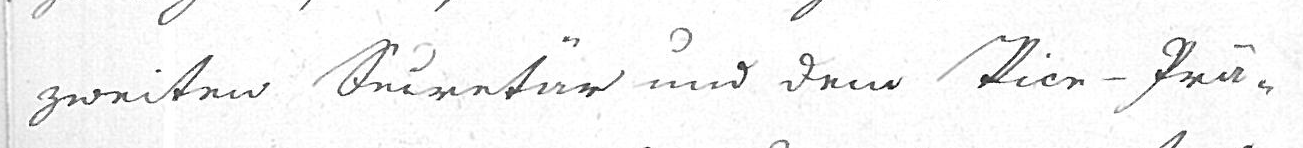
zweiten Secretär und dem Vice-Prä-
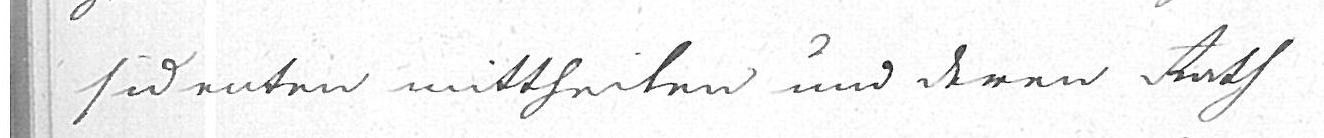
sidenten mittheilen und deren Rath
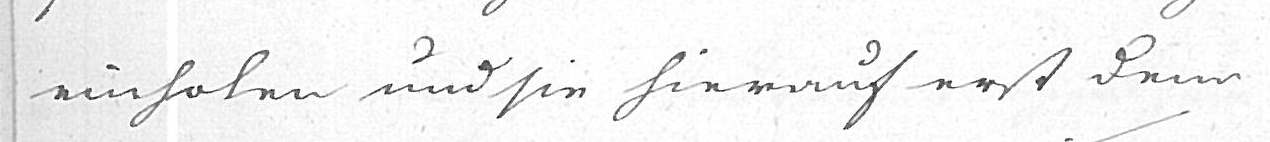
einholen und sie hierauf erst dem
